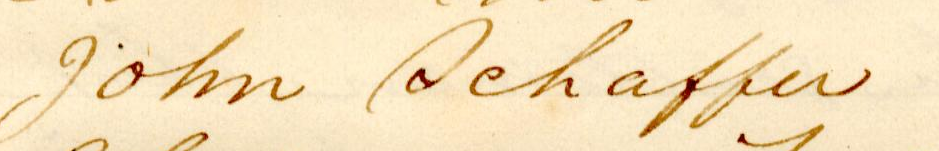John Schaffer
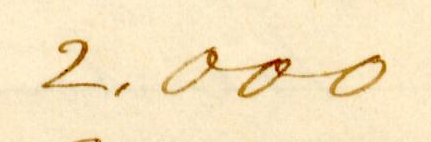2,000
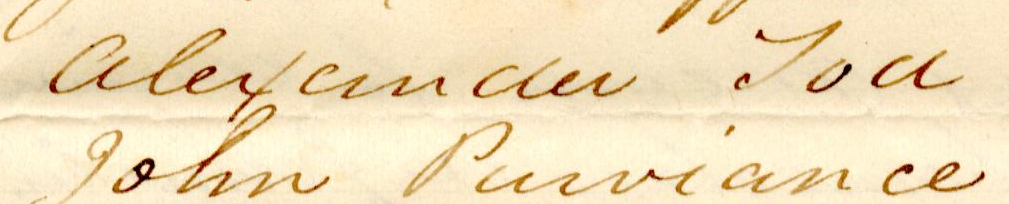Alexander Tod
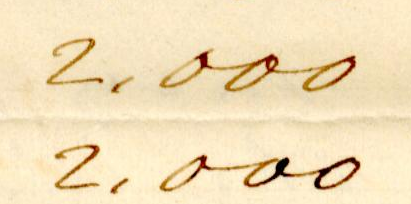2,000
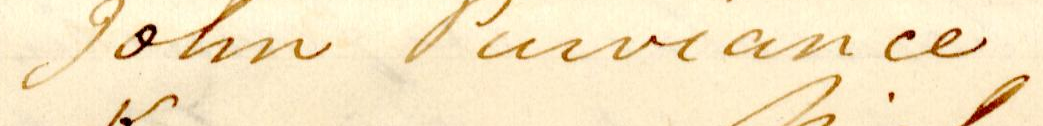John Purviance
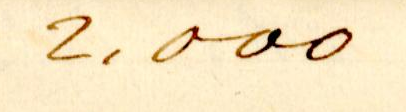2,000
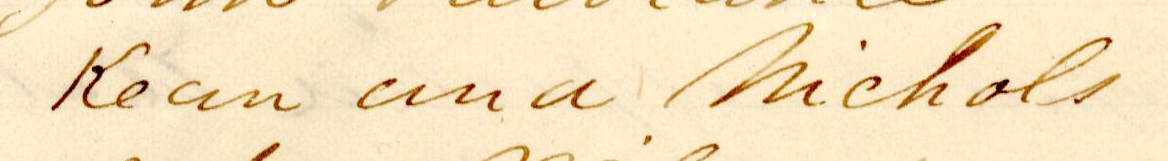Kean ana Nichols
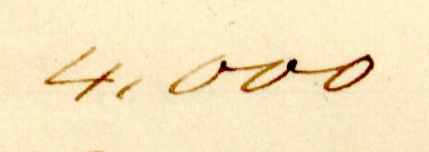4,000
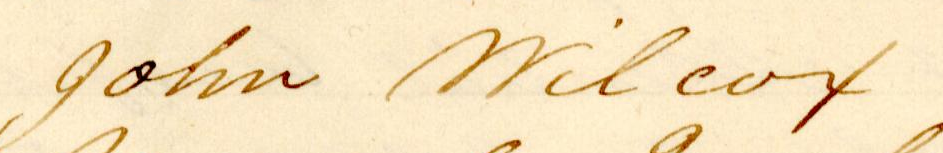John Wilcox
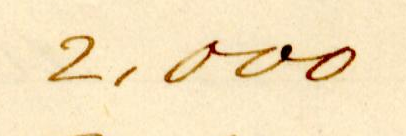2,000
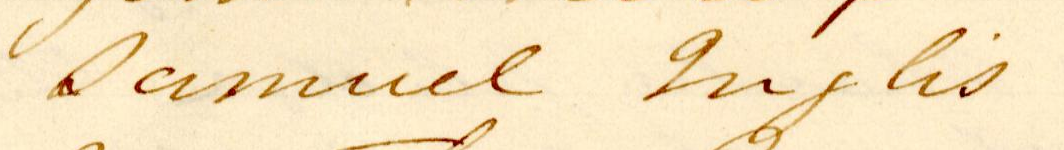Samuel Inglis
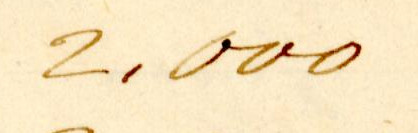2,000
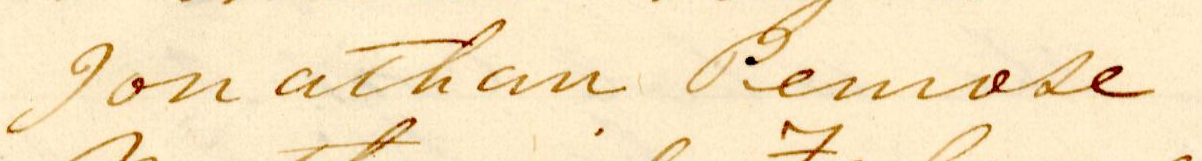Jonathan Penrose
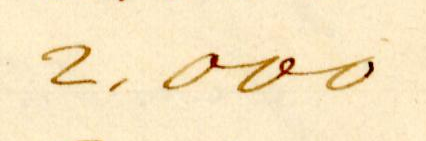2,000
